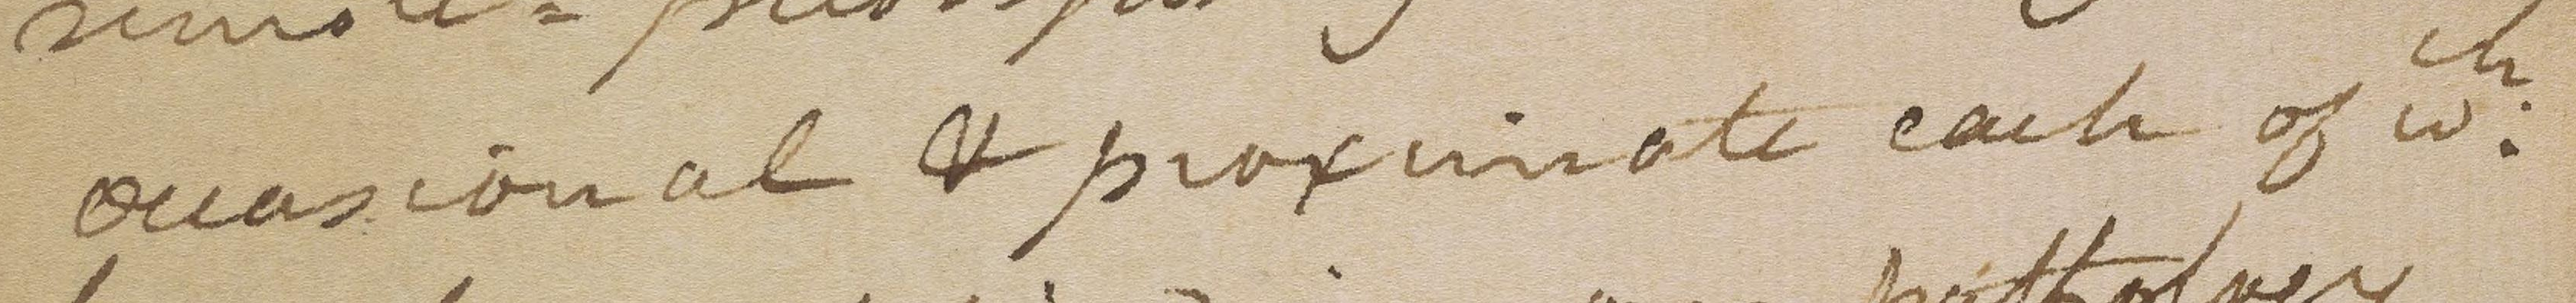occasional & proximate each of w^ch
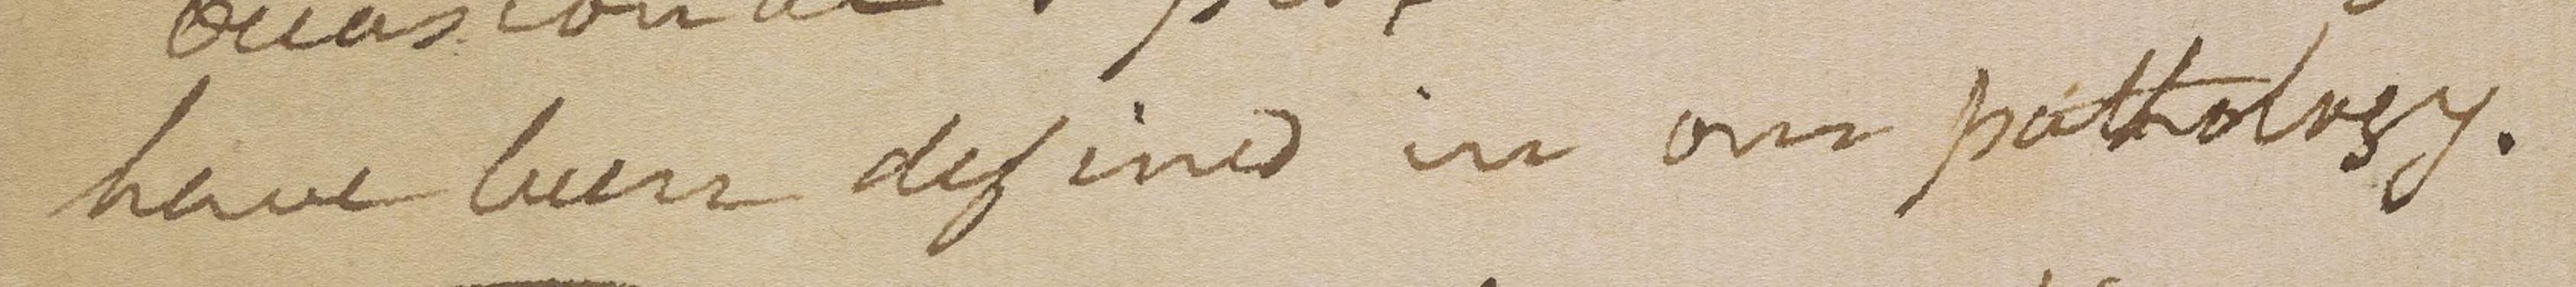have been defined in our pathology.
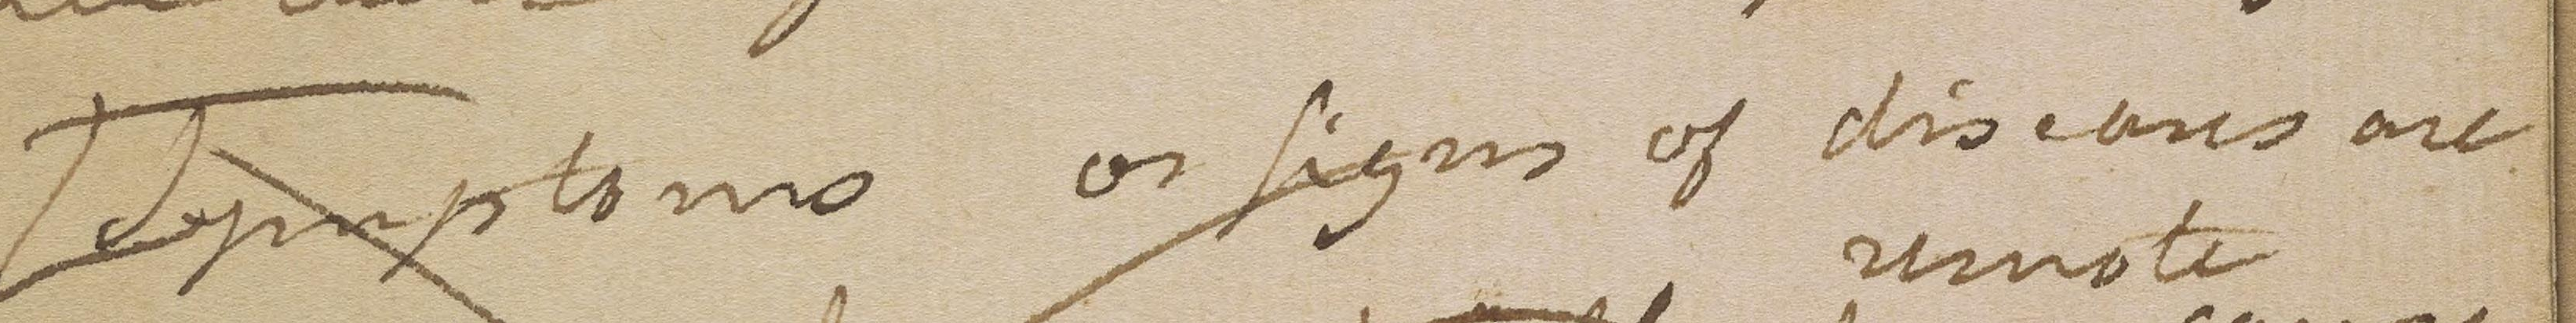(Symptoms or signs of diseases are
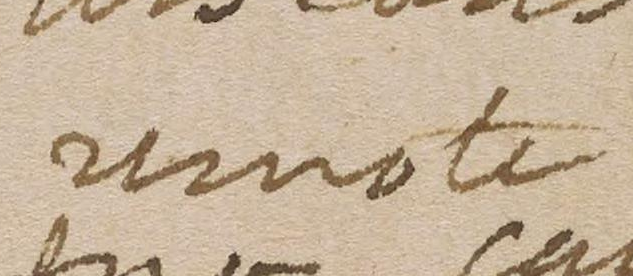remote
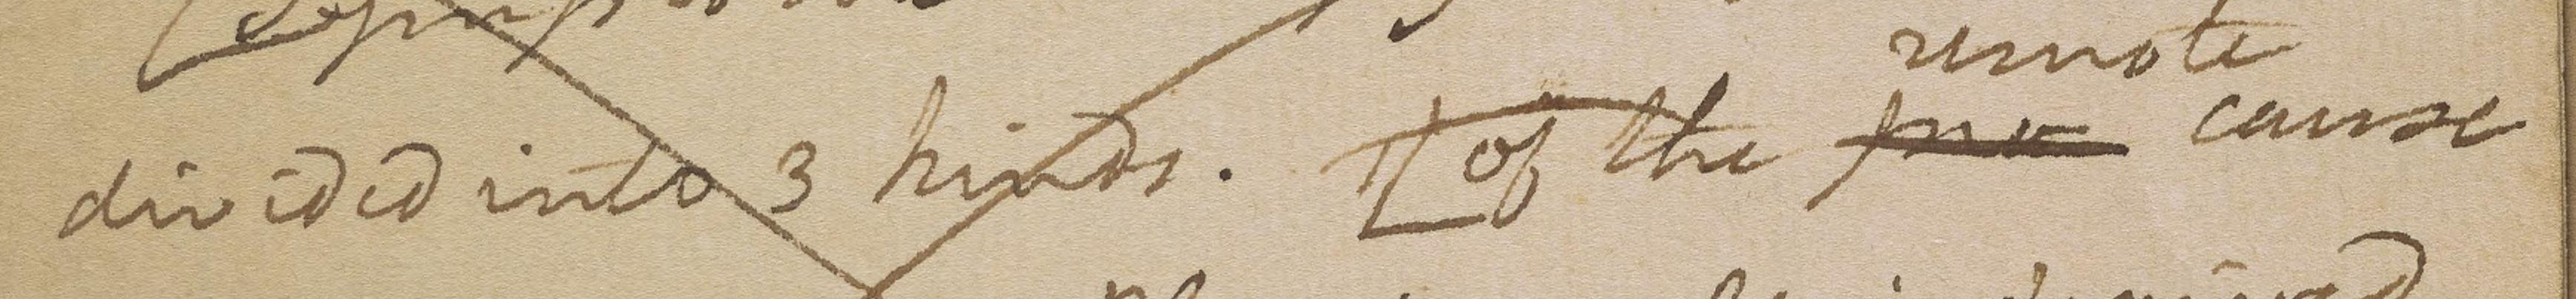divided into 3 kinds. (of the [____] cause
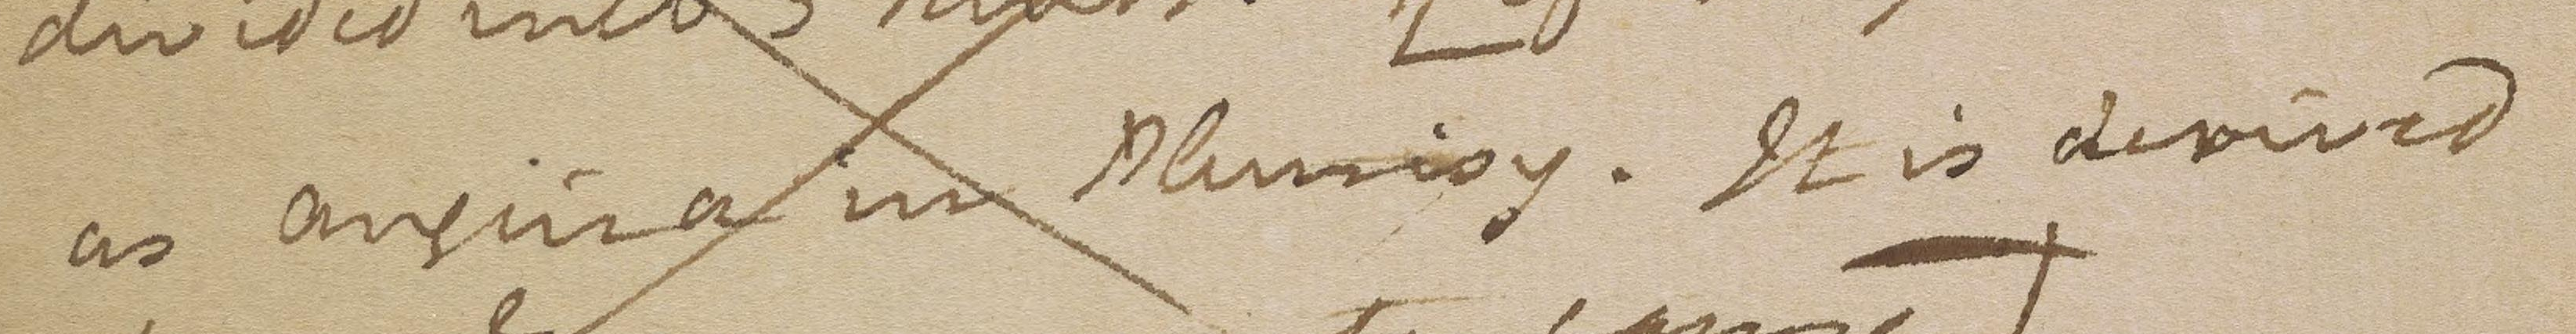as angina in pleurisy. It is devised
